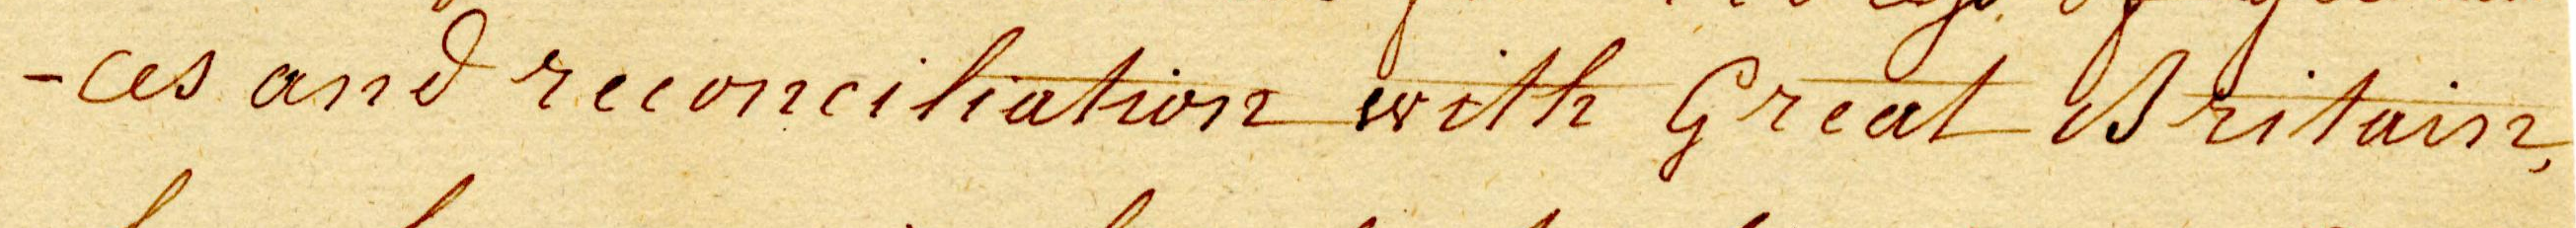-ces and reconciliation with Great Britain,
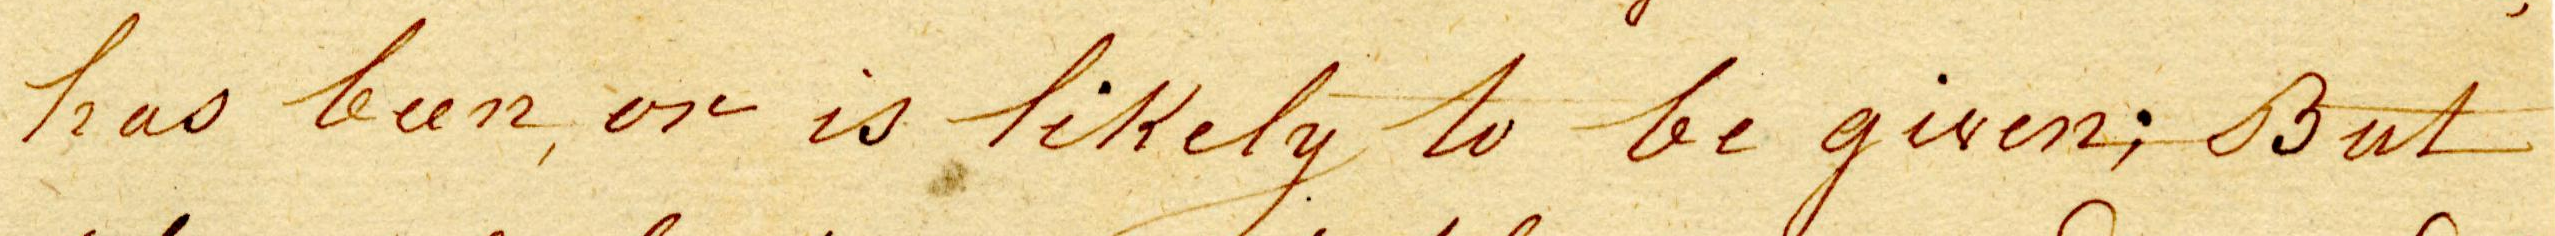has been, or is likely to be given; But
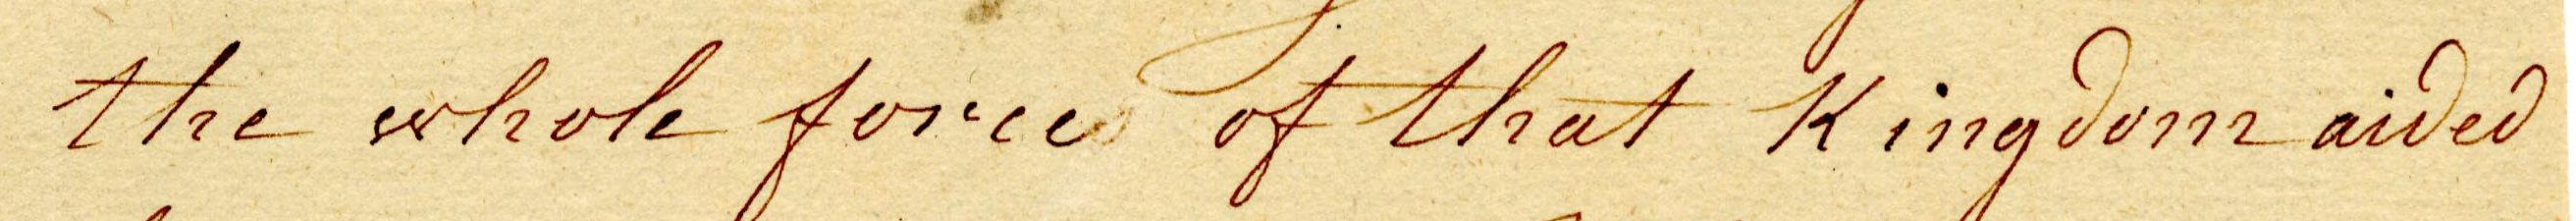the whole forces of that Kingdom aided
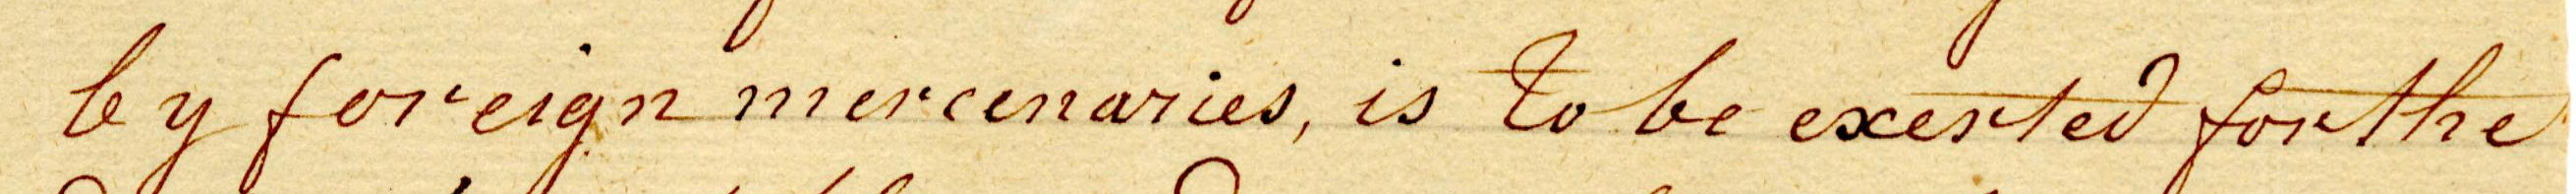by foreign mercenaries, is to be exerted for the
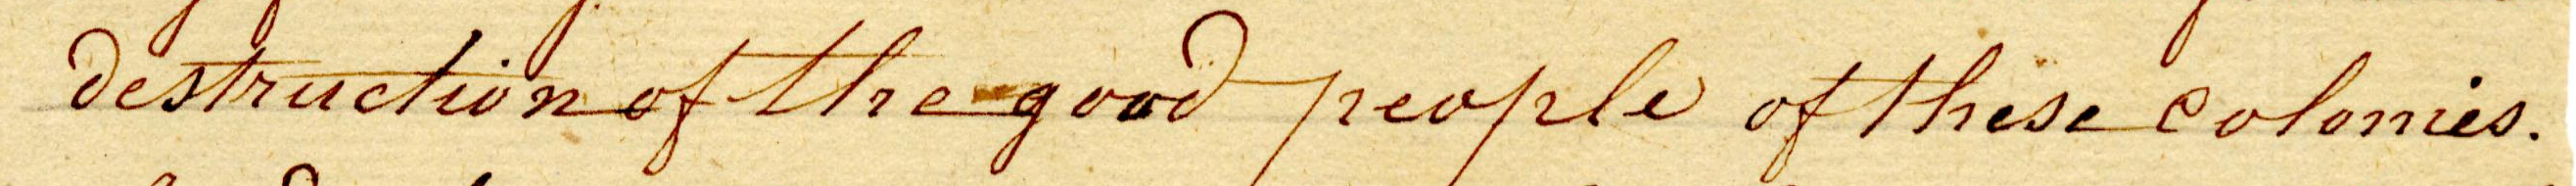destruction of the good people of these colonies.
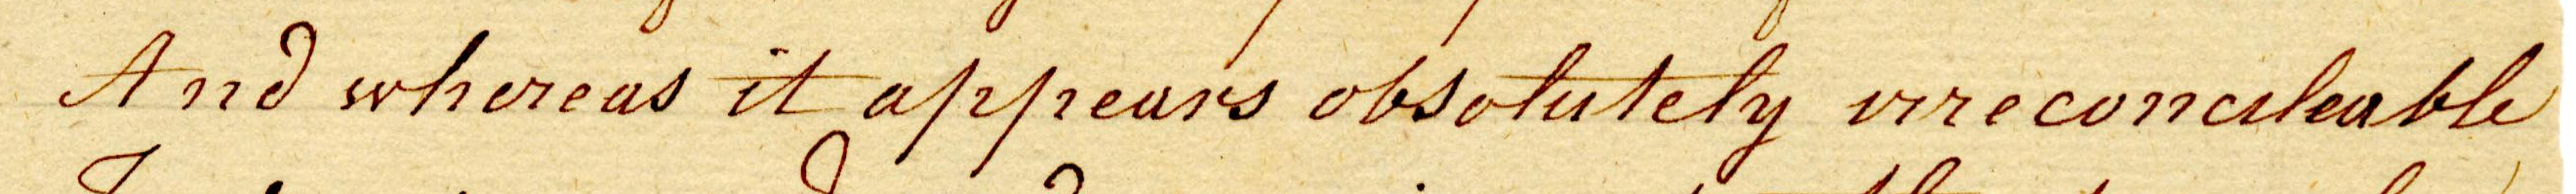And whereas it appears obsolutely irreconcileable
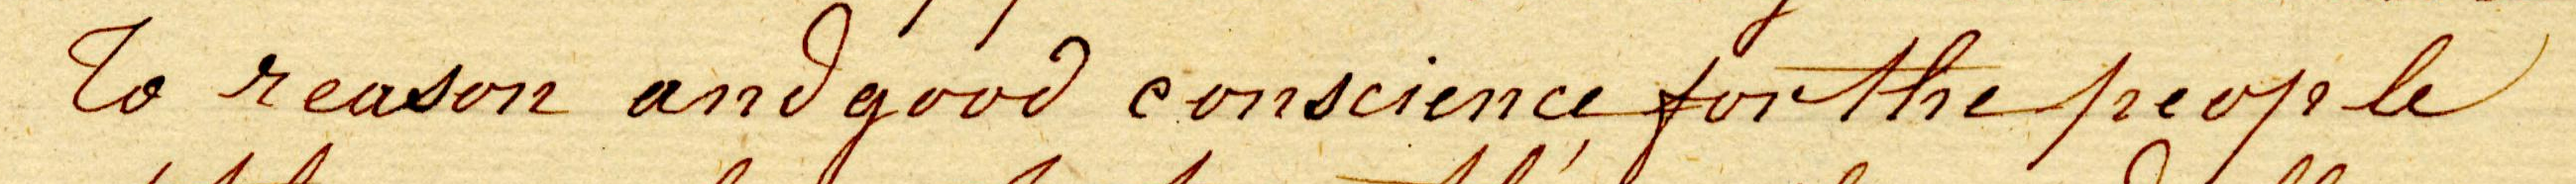To reason and good conscience, for the people
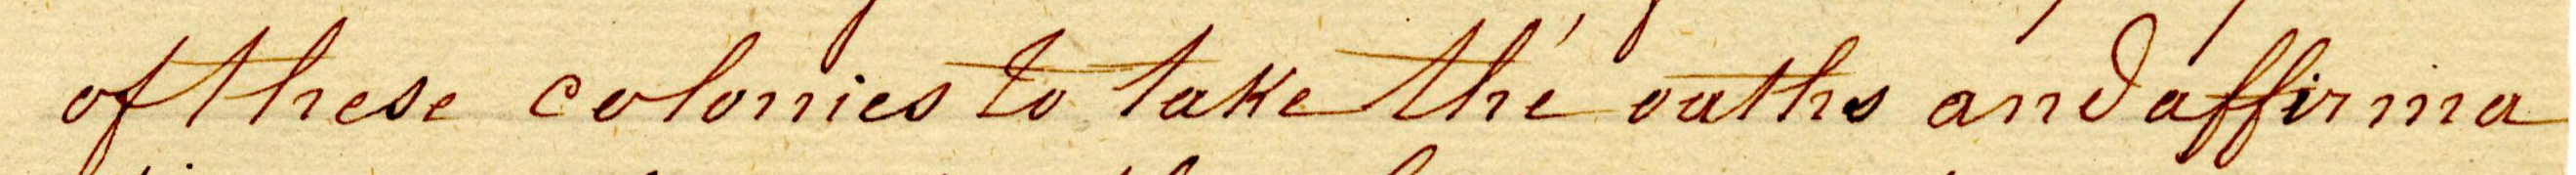of these colonies To take the oaths and affirma
